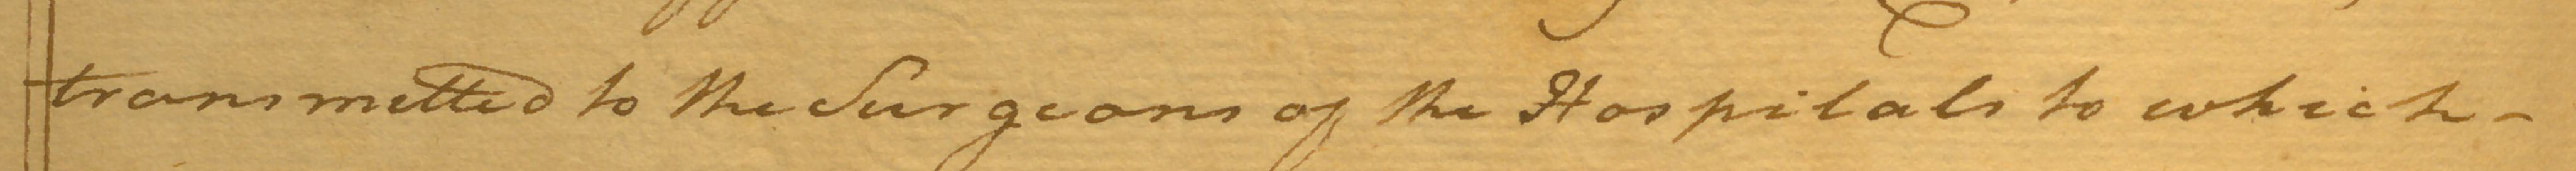transmitted to the Surgeons of the Hospitals to which
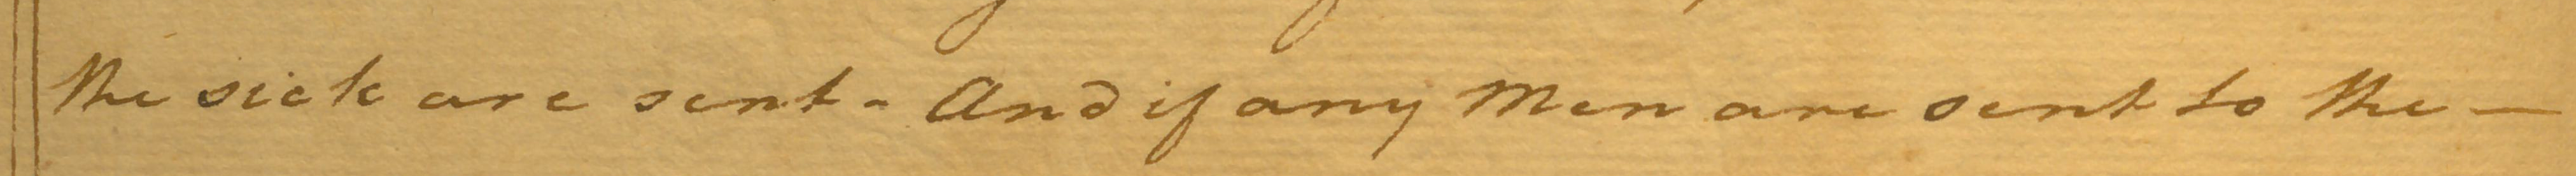the sick are sent- And if any Men are sent to the-
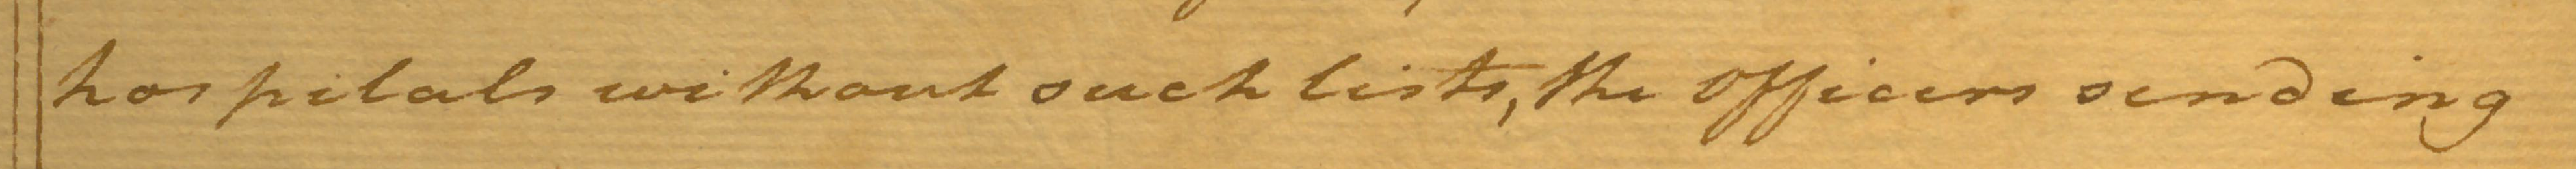hospitals without such lists, the Officers sending
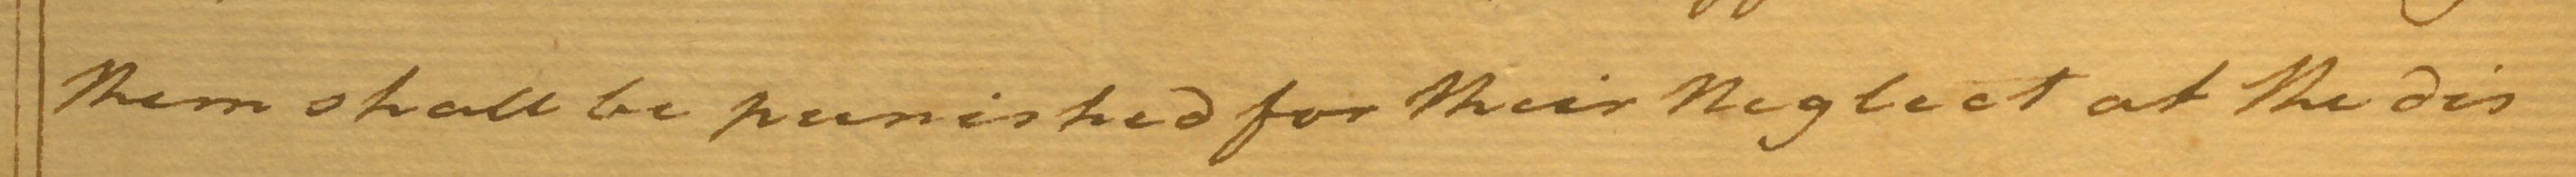them shall be punished for their Neglect at the dis
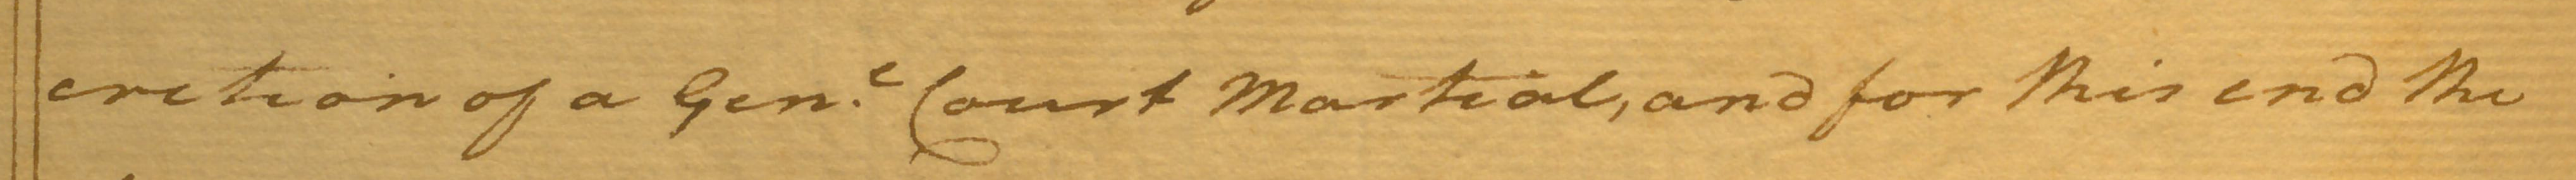cretion of a Gen^l. Court Martial, and for this end the
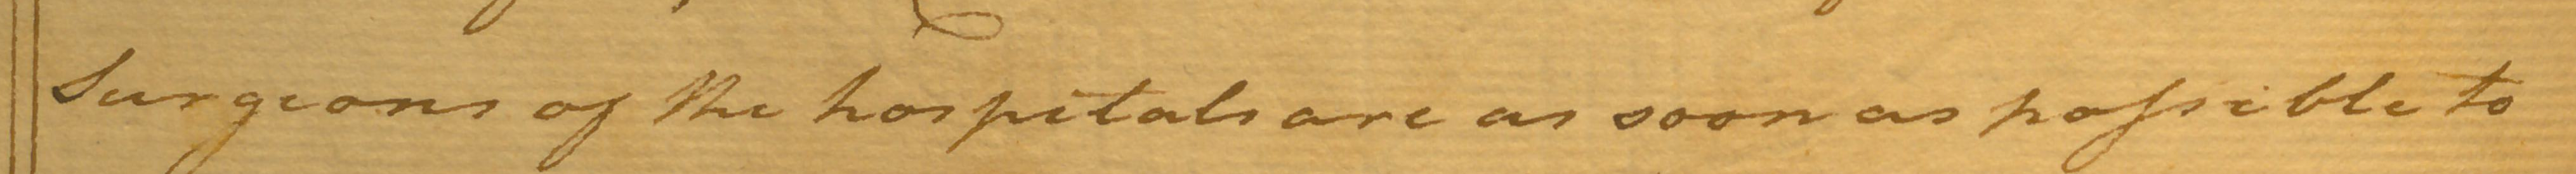Surgeons of the hospitals are as soon as possible to
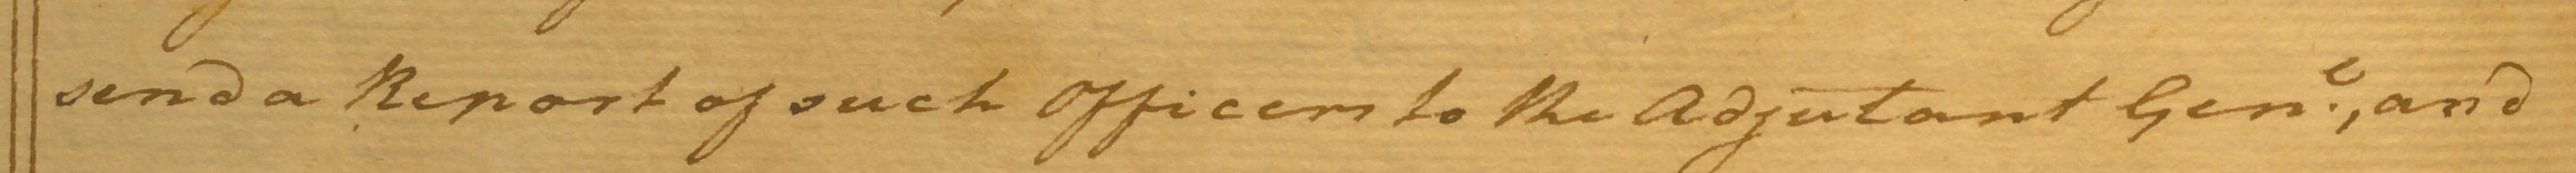send a Report of such Officers to the Adjutant Gen^l., and
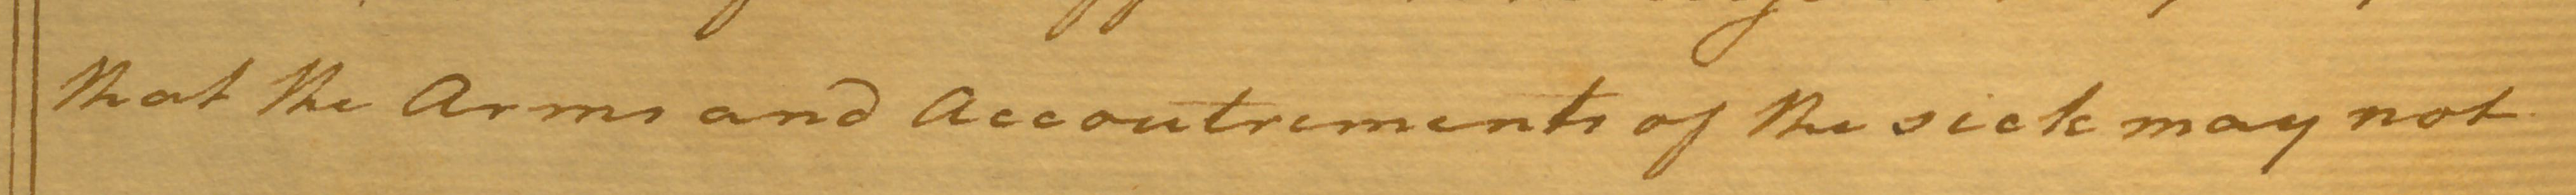that the Arms and Accountrements of the sick may not
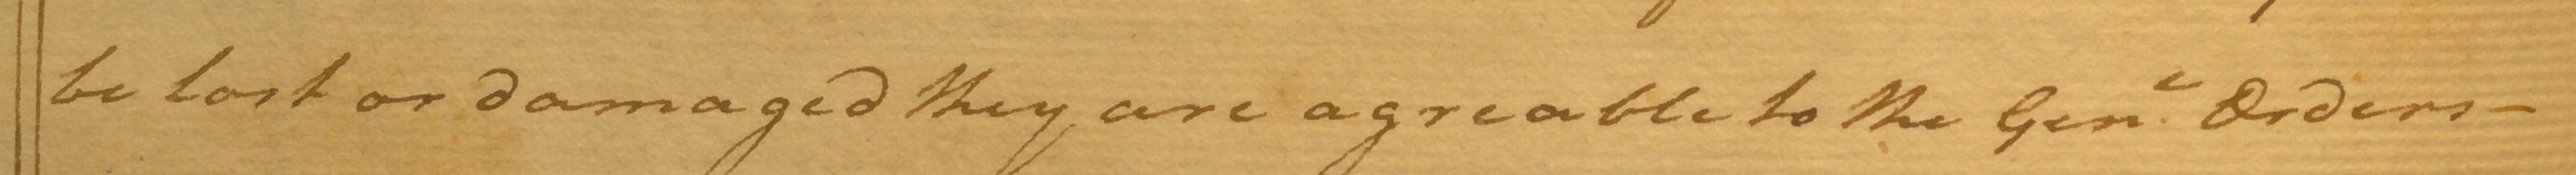be lost or damaged they are agreable to the Gen^l. Orders-
